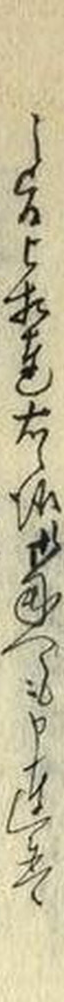之旨被相達右之趣御用人へも申達置候
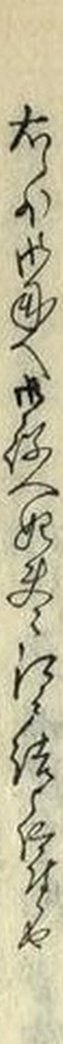右之外御用人御役人始夫々江戸詰被仰付候由
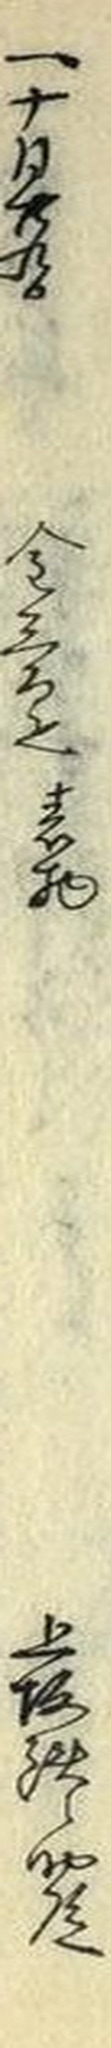一十月廿九日金三百疋表物上坂鉄之助殿
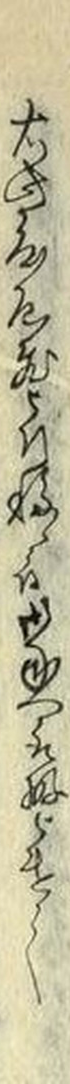右此度屋敷被引移候ニ付御用人取扱被遣之
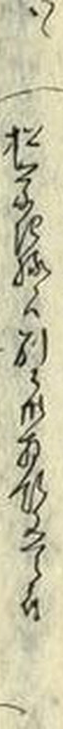松栄院様へハ別ニ御拝領有之ニ付
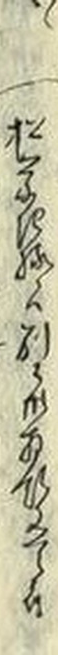松栄院様へハ別ニ御拝領有之ニ付
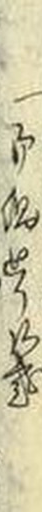御側廻り頂戴
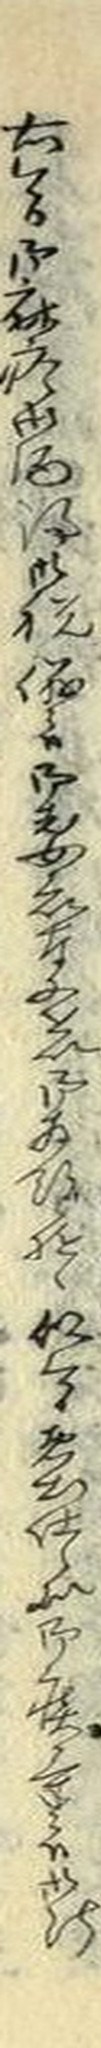右今日御麻疹御酒湯御祝儀ニ付御老女衆奉文を以御拝領被遊候但今日惣出仕之処御疾気ニ付御断
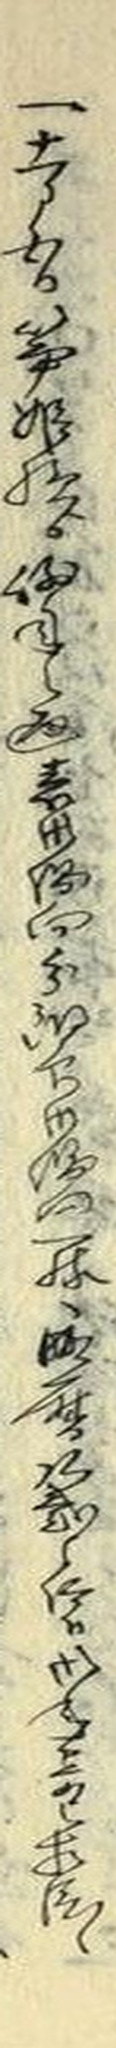一十一月五日箏姫様ゟ例年之通表御側向分銅印御側向一統へ略暦頂戴被仰付御年寄被相渡候
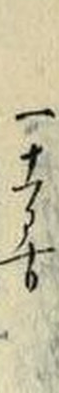一十一月四日
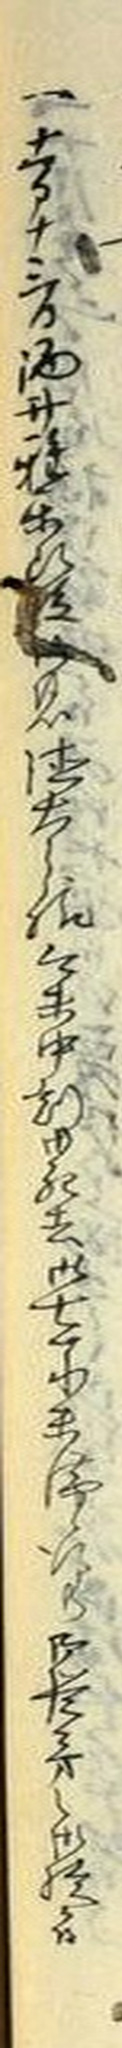一十一月十三日酒井雅樂頭殿御息徳太郎様今未中刻死去御七歳未満候得共御従弟之御続ニ付
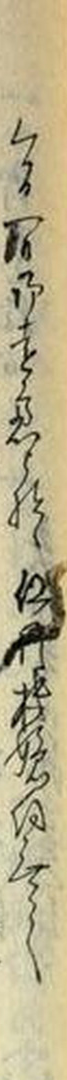今日一日御遠慮被遊候但御機嫌伺無之
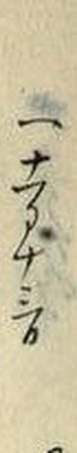一十一月四日
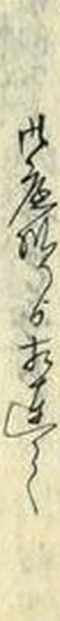御庭掛りゟ相達之
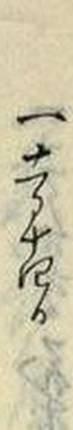一十一月四日
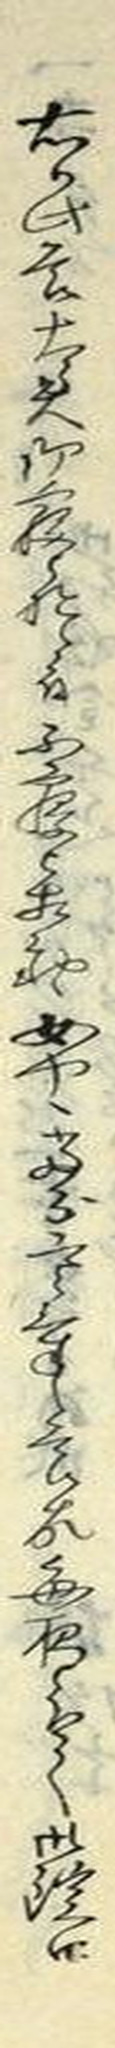右ハ此節大奥御寝被遊候ニ付不寝被相勤候女中へ当分寒気之節故毎夜被下之御錠口
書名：少傅日録抄（斉善付側向頭取日記、在府）
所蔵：福井県文書館 Fukui Prefectural Archives
